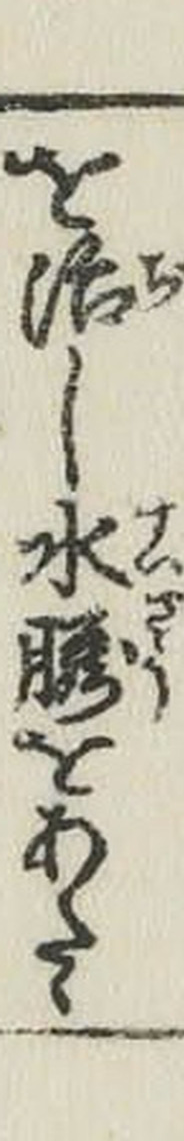を治し水臓をあたゝ
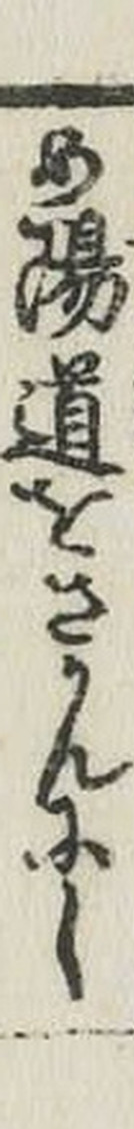め陽道をさかんにし
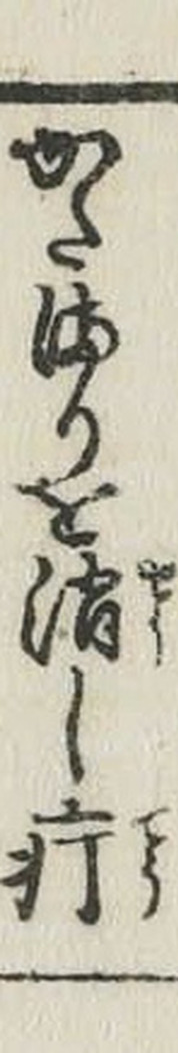かたまりを消し疔
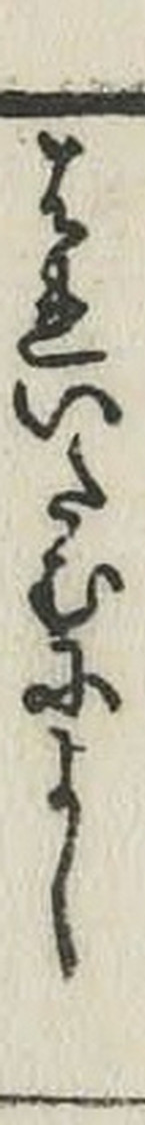はれいたむによし
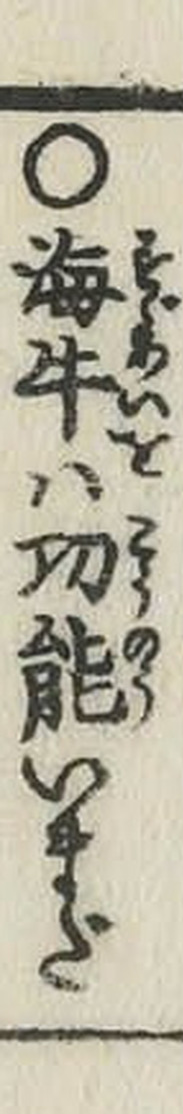○海牛は功能いまだ
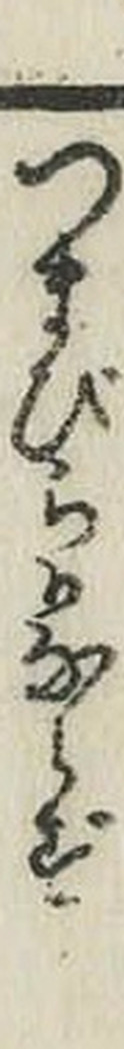つまびらかならず
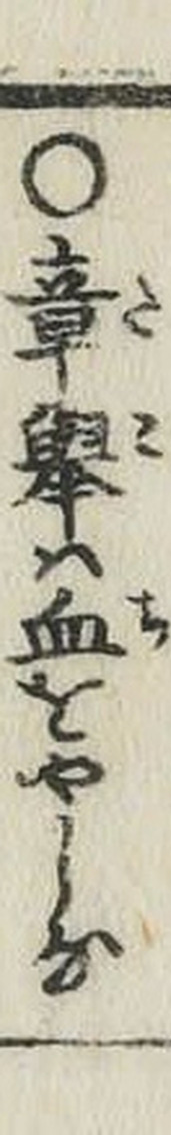○章挙は血をやしな
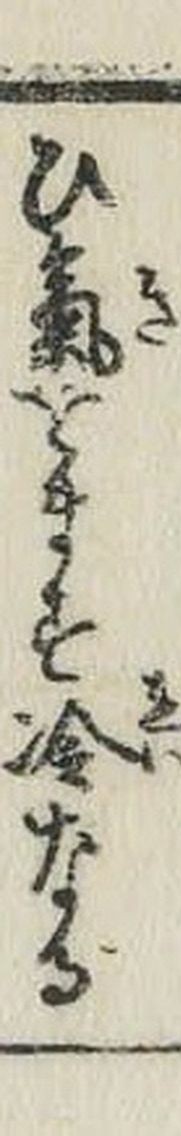ひ気をます冷なる
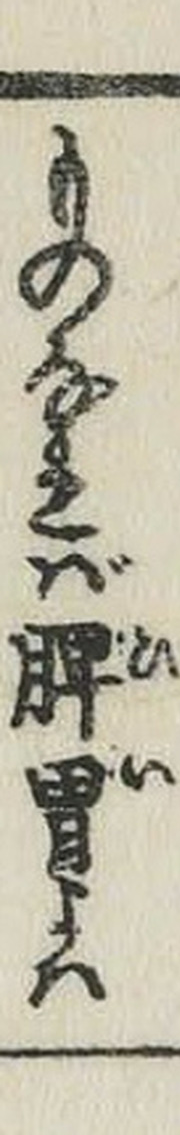ものなれば脾胃よは
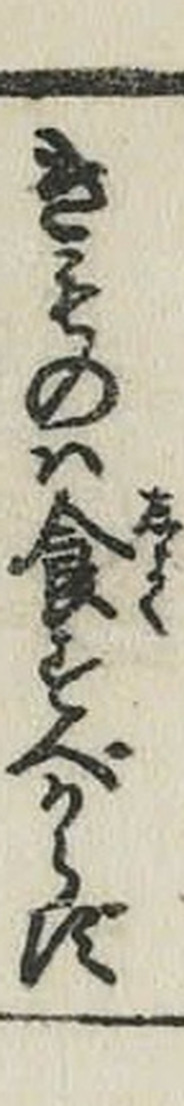きものは食すべからず
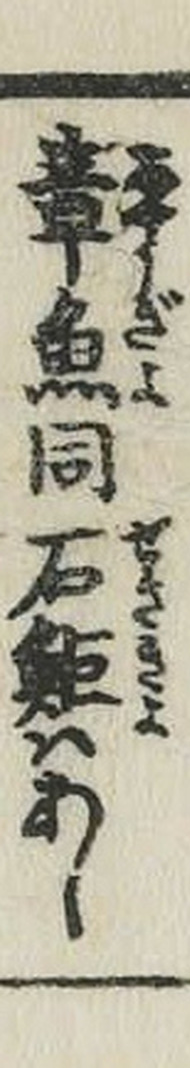章魚同石鮔はあし
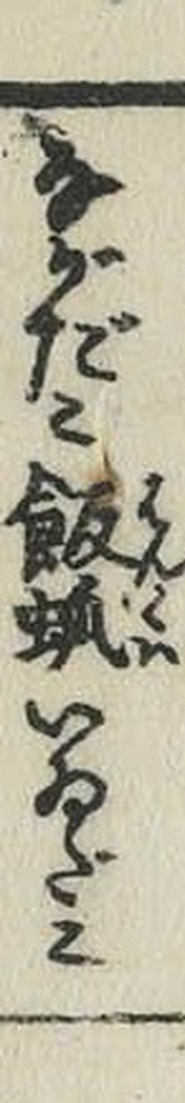ながだこ飯蛌いゐだこ

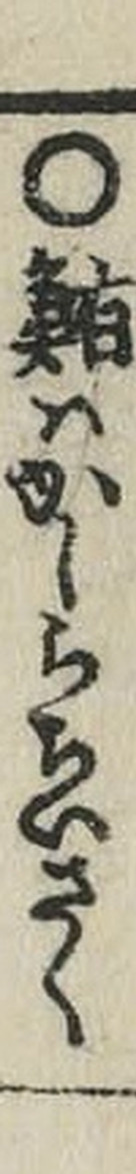○鮪はかしらちいさく
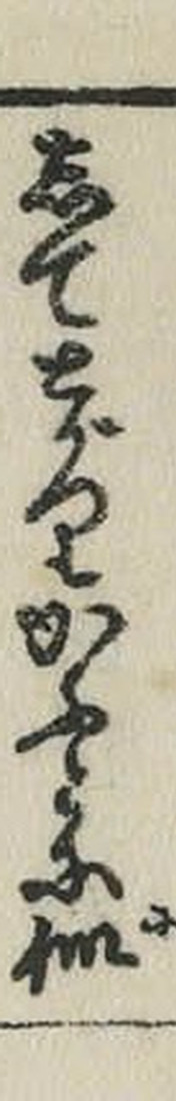してとがりかふとに似
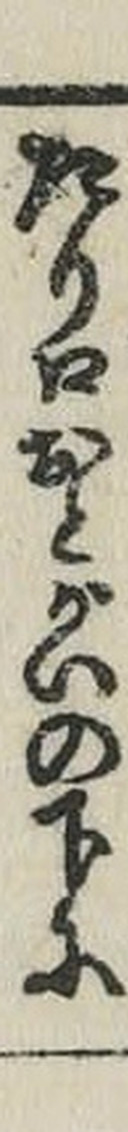たり口おとがいの下に
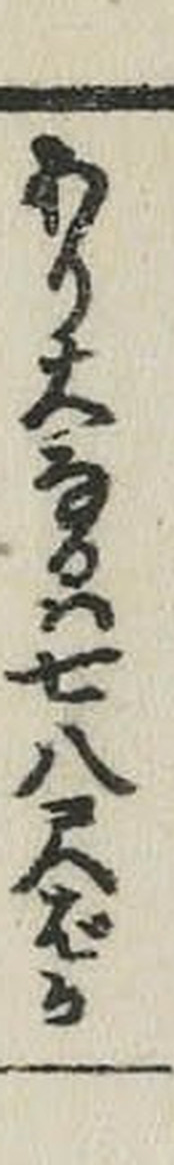あり大なるは七八尺ばか
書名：増補頭書訓蒙図彙大成 10巻 7:巻之14-16
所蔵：東京学芸大学教育コンテンツアーカイブ
